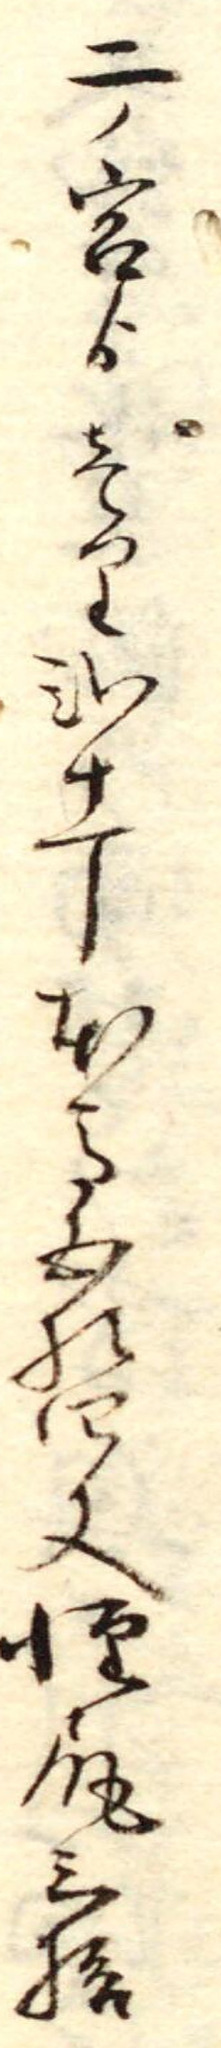二ノ宮ゟ壱里弐十丁本馬五拾四文軽尻三拾
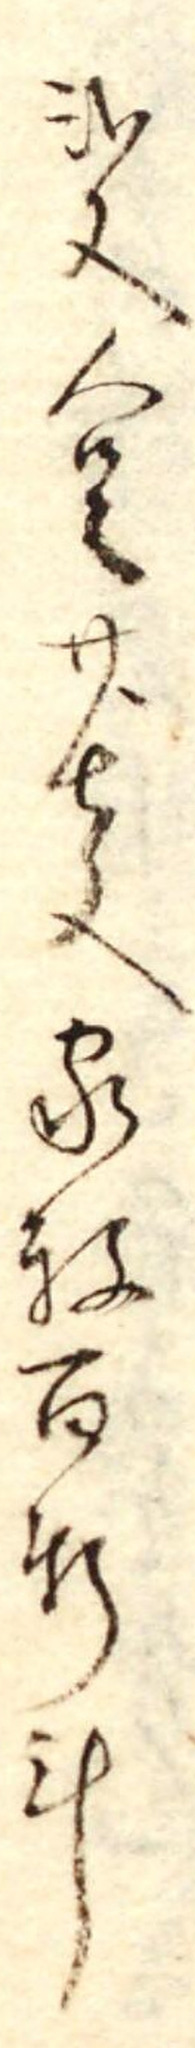弐文人足廿七文家数百軒計
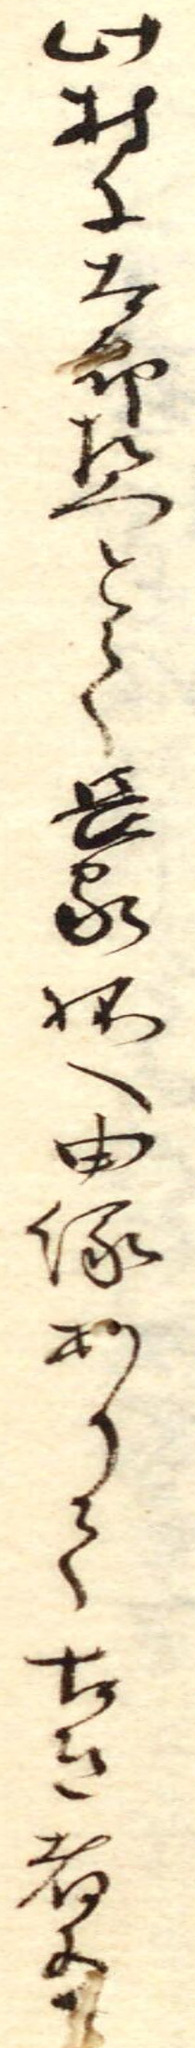此村に太郎左衛門とて長家抔へ由縁ありて古き者有
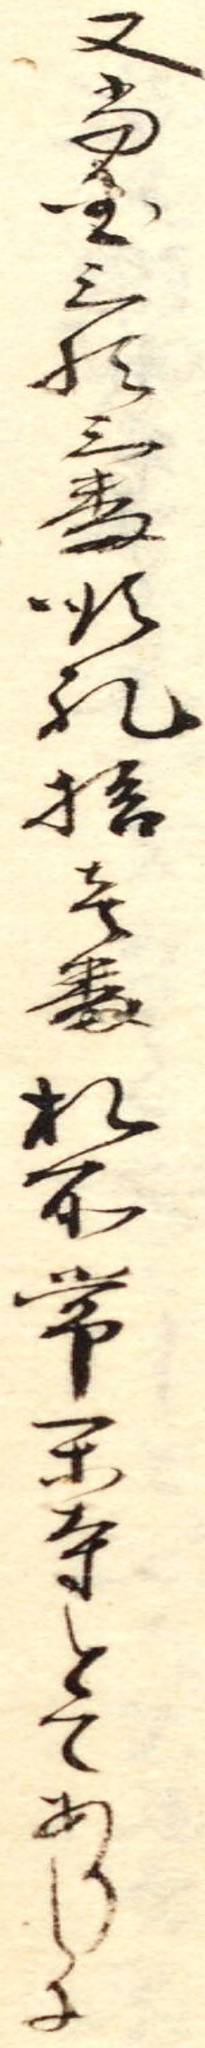又当国三拾三番順礼拾壱番札所常楽寺とてありしに
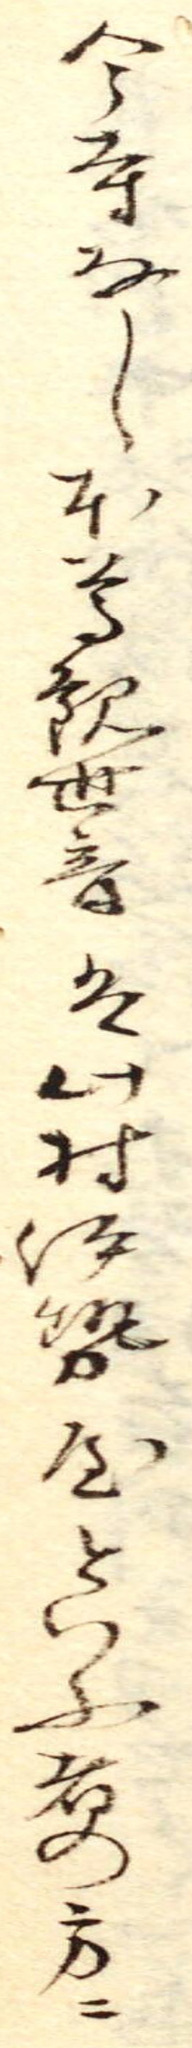今寺なし本尊観世音は此村伊勢屋といふ者の方に
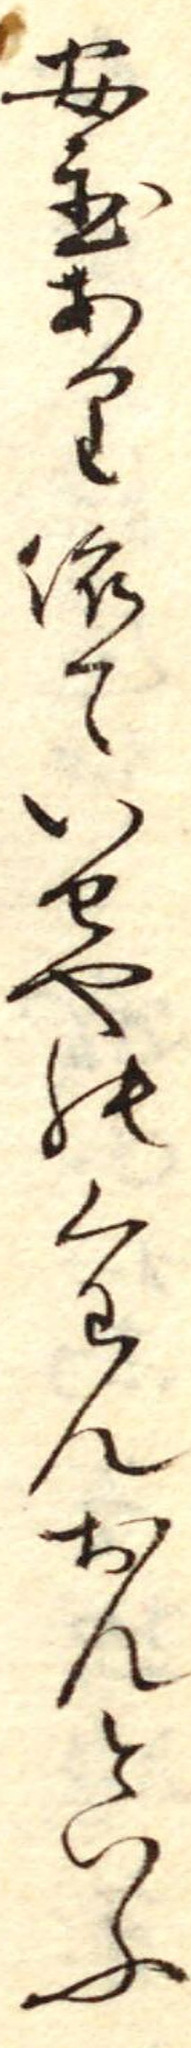安置あり依ていせやのくわんおんといふ
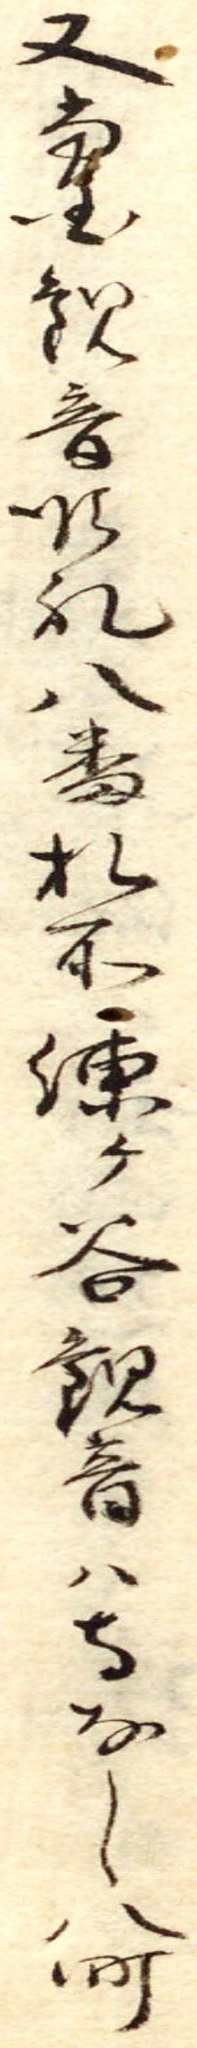又当国観音順礼八番札所練ヶ谷観音は寺なし八町
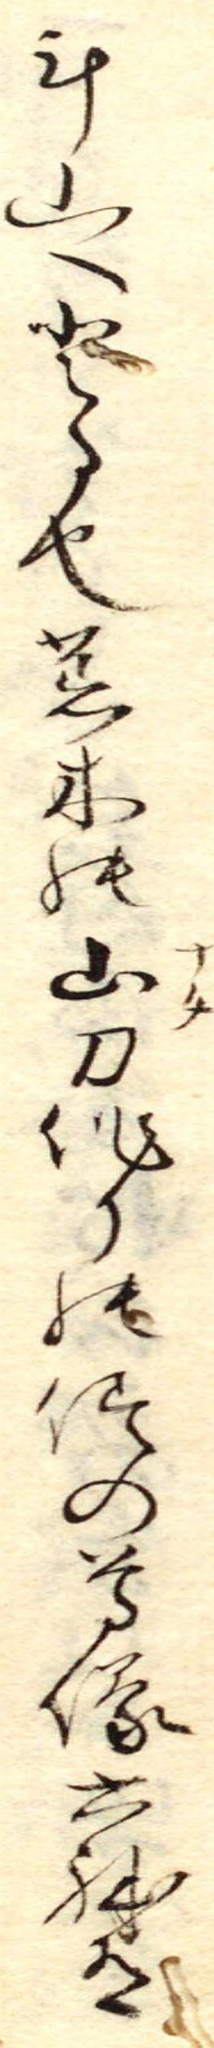計山へ登る也荒木の山刀作りの侭の尊像六躰有
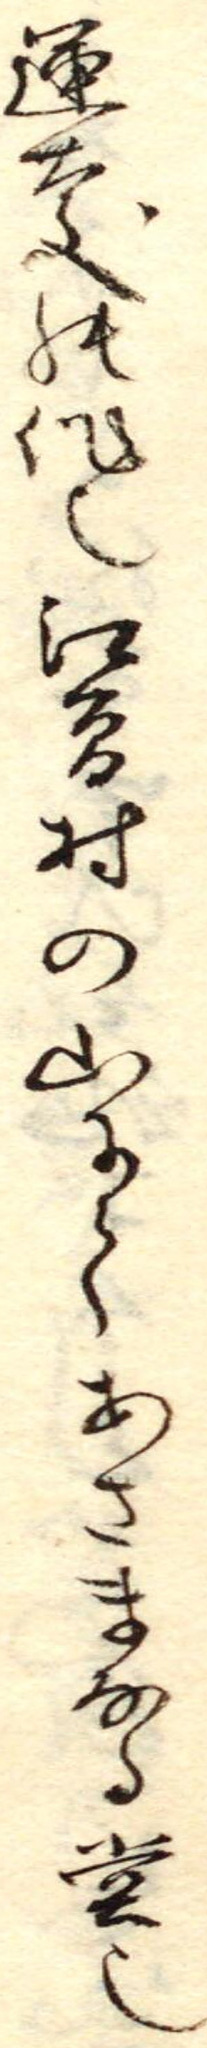運慶の作也江曽村の山にてあさまなる堂也
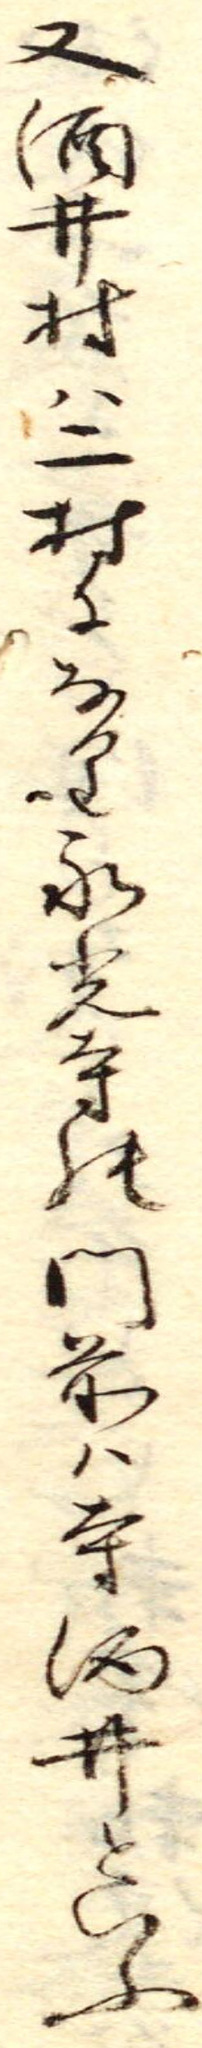又酒井村は二村になり永光寺の門前は寺酒井といふ
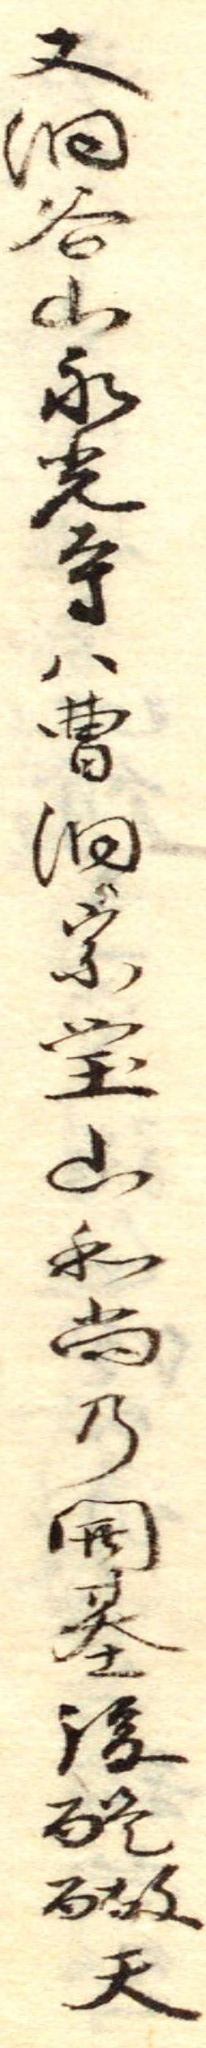又洞谷山永光寺は曹洞宗瑩山和尚の開基御醍醐天
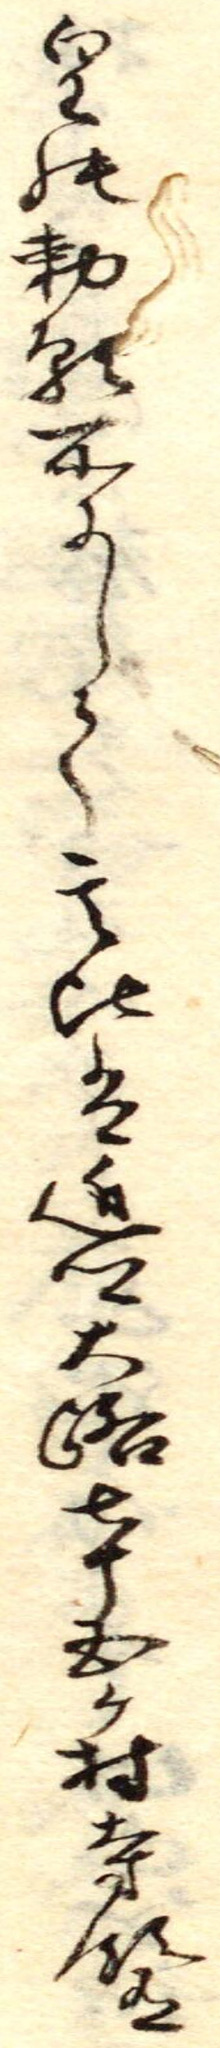皇の勅願所にして其比は近郷大路七十五ヶ村寺領有
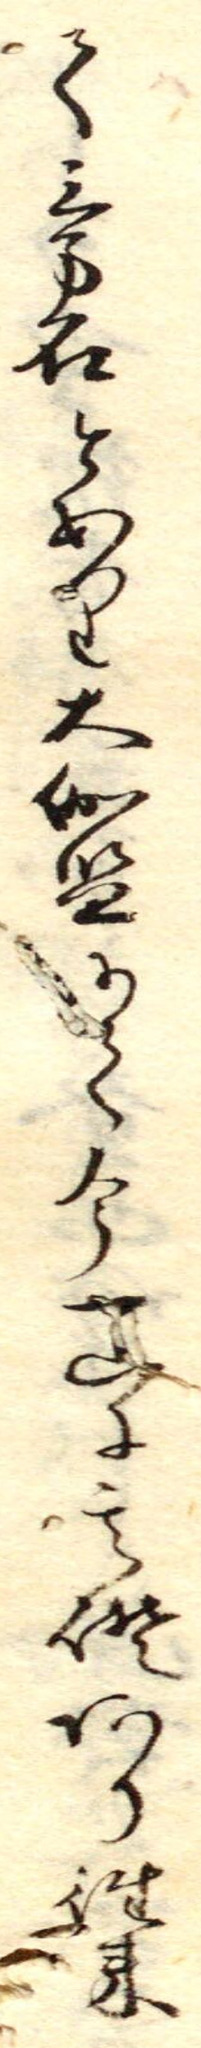て三万石とあり大伽藍にて今一山に其礎あり往来
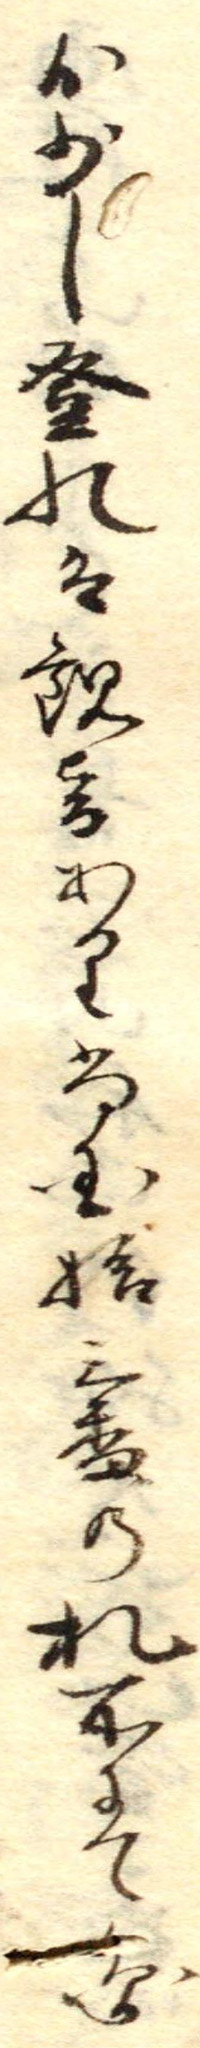ゟ少し登れは観音あり当国拾三番の札所にて円

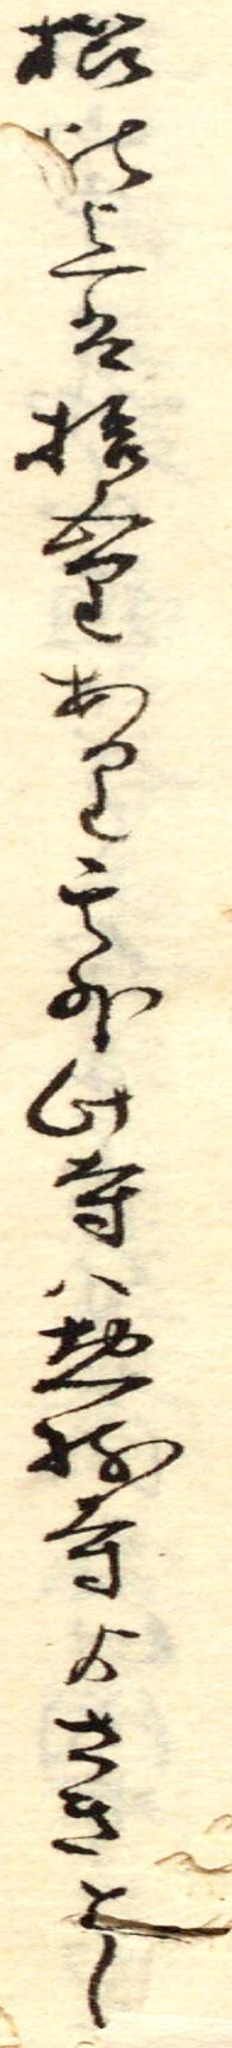櫛比迄は拾五里あり其外此寺は惣持寺ゟさきとし
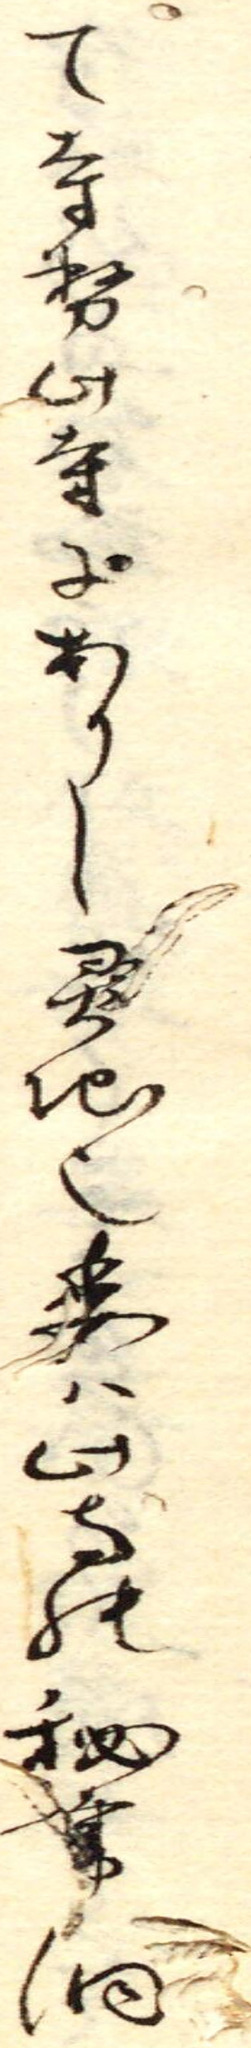て寺務此寺にありし霊地也委は此寺の秘書洞
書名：能登名跡誌
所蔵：Ishikawa Prefectural Library
